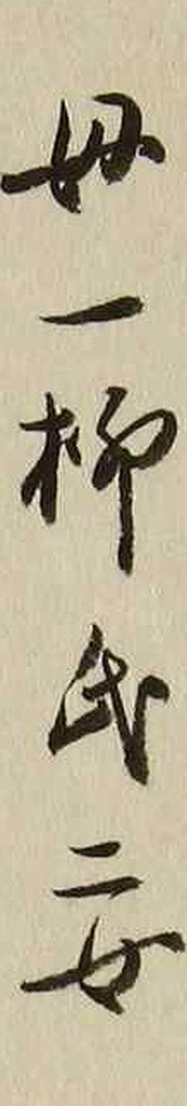母一柳氏二女
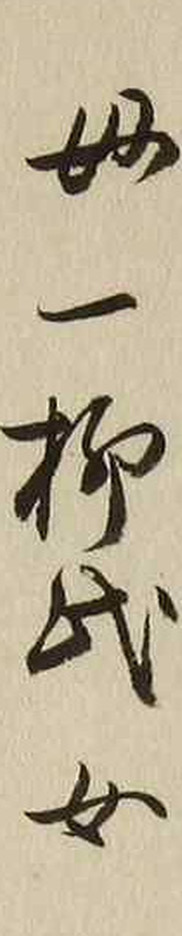母一柳氏女
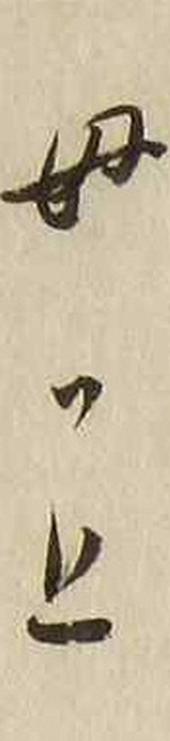母同上

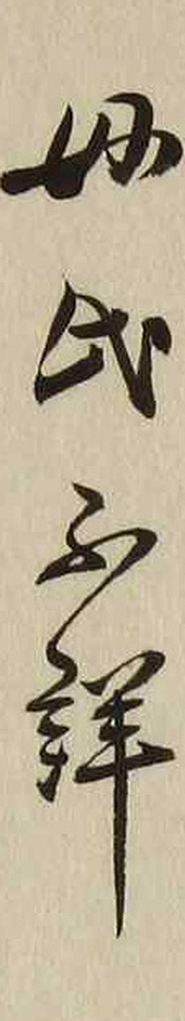母氏不詳
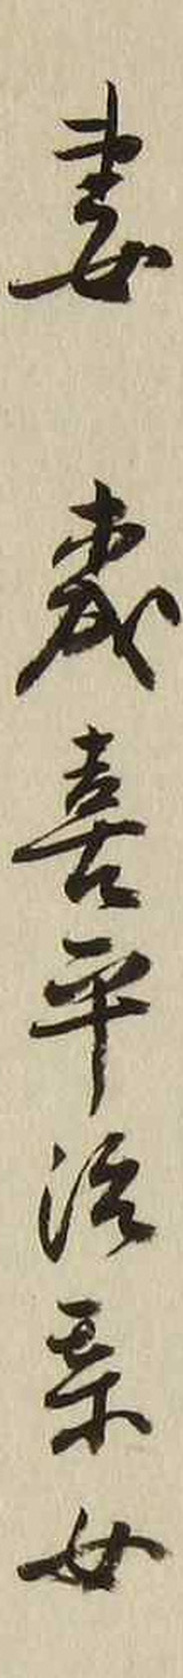妻森喜平治某女
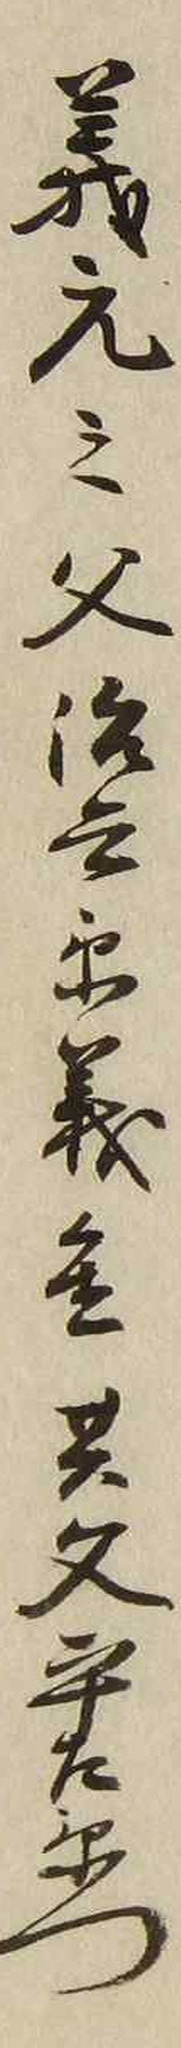義元之父治兵衛義重其父平左衛門
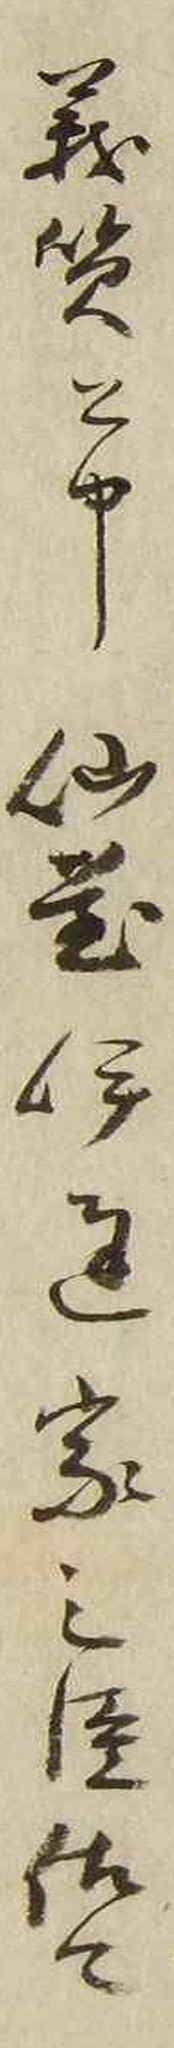義質と申仙台伊達家之臣佐々

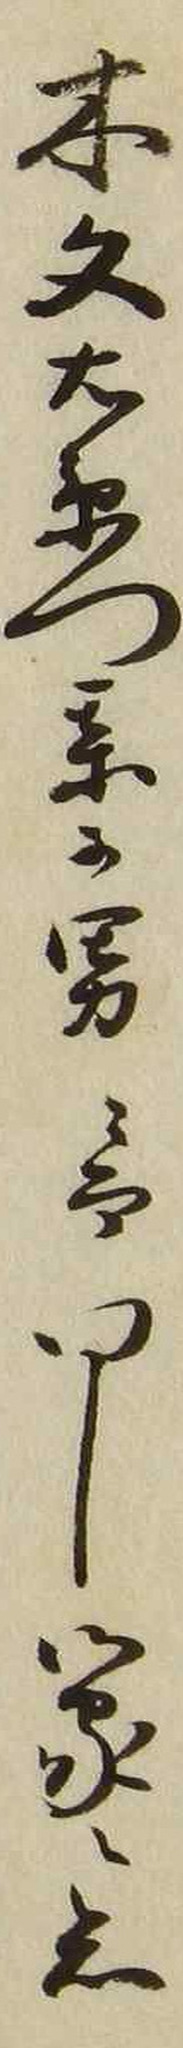木文右衛門某か男ニ而同し御家ニ知
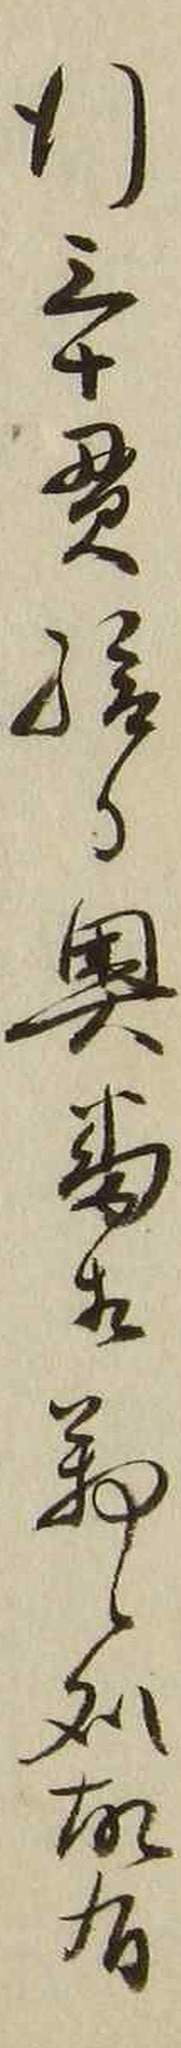行三十貫給る奥番相勤候処故有
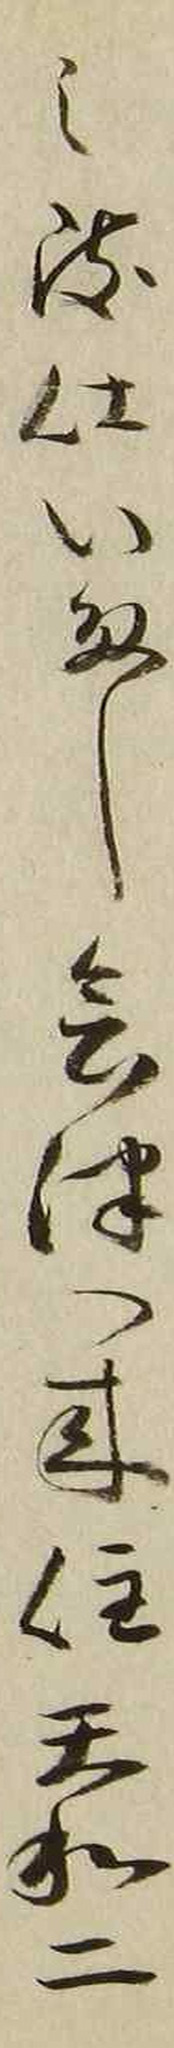之致仕いたし会津へ来住天和二
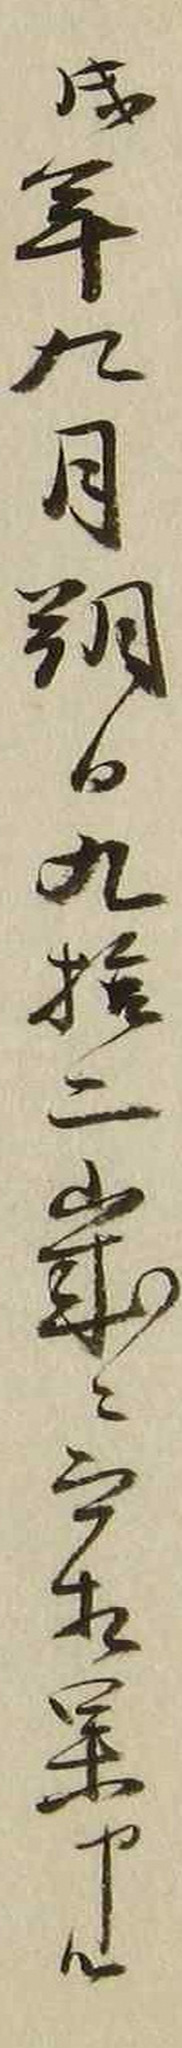戊年九月朔日九拾二歳ニ而相果申候
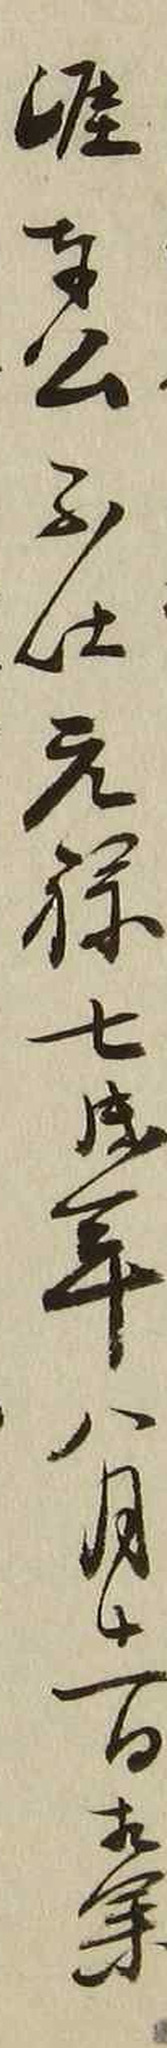涯奉公不仕元禄七戌年八月十一日相果
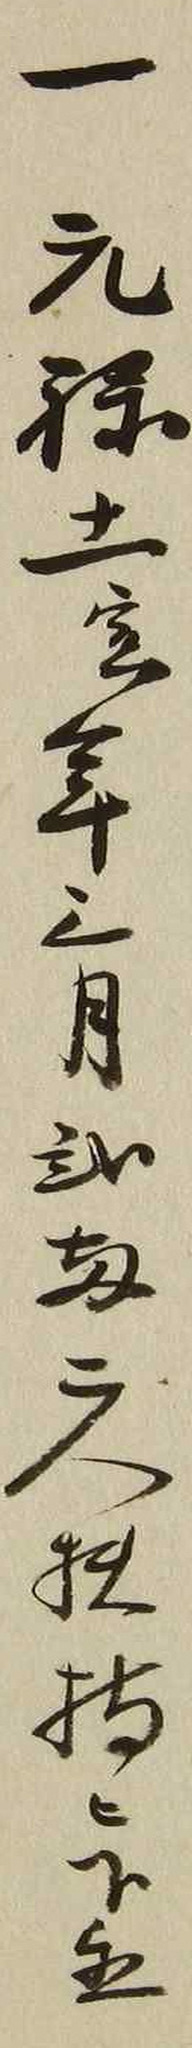一元禄十一寅年三月弐両二人扶持被下置
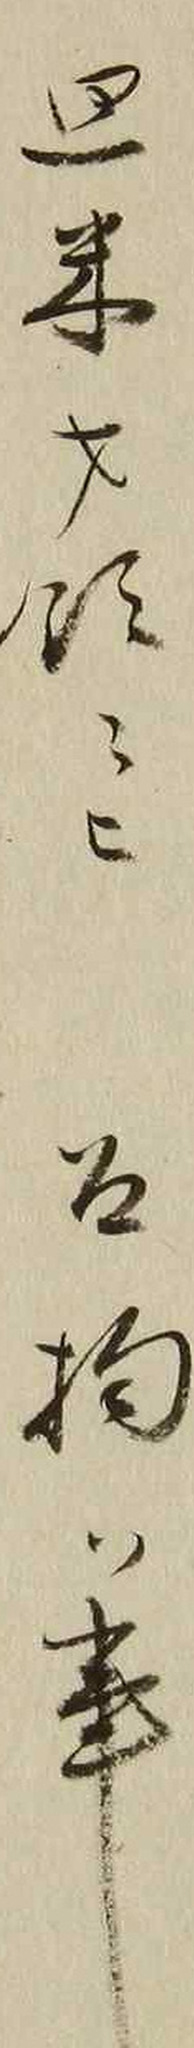廻米才領ニ被召抱候事
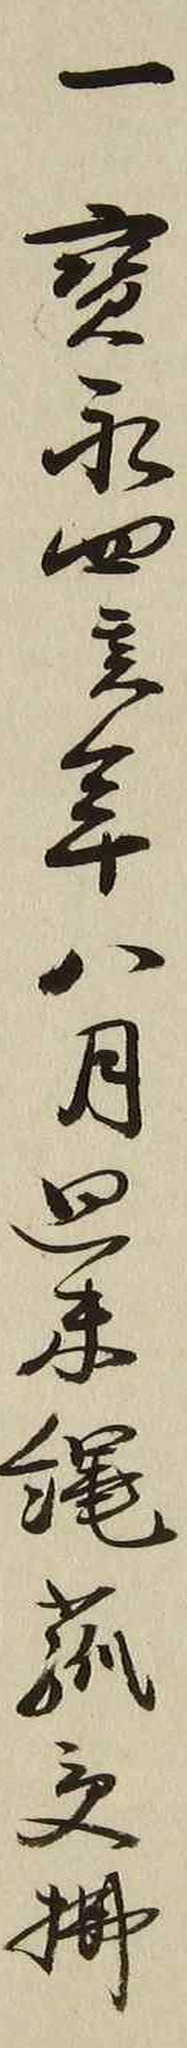一宝永四亥年八月廻米縄菰受払
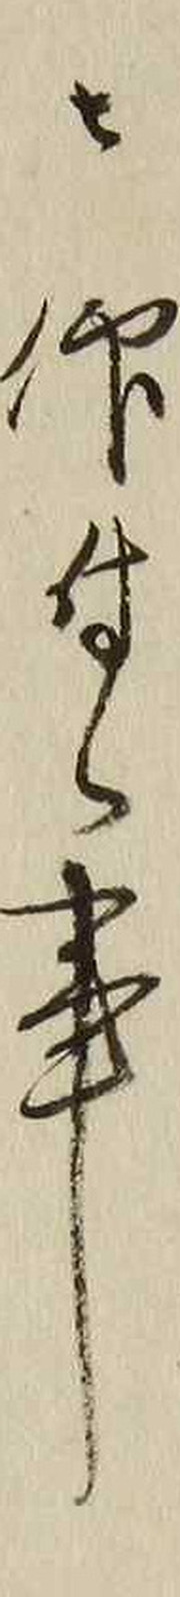被仰付候事
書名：諸士系譜　巻之288　さ之部20
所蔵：会津若松市立会津図書館
